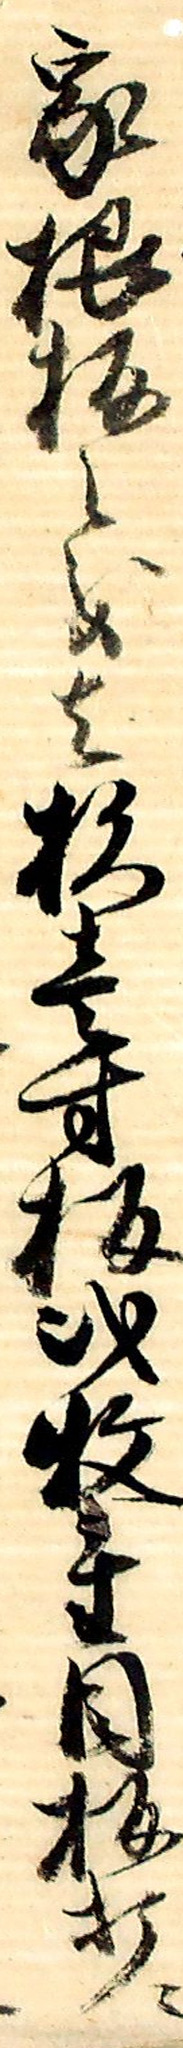屋根板之義は杉壱寸板弐枚重目板打に
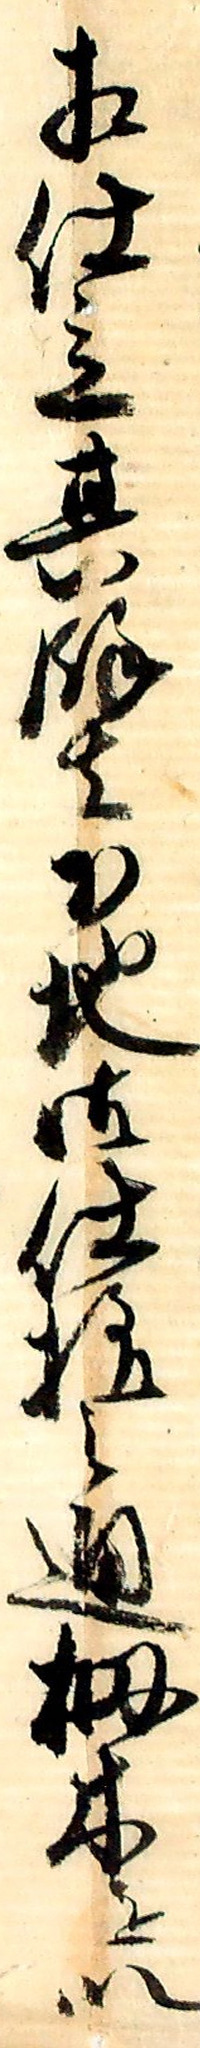相仕立其余は下地御仕様之通栂木を以
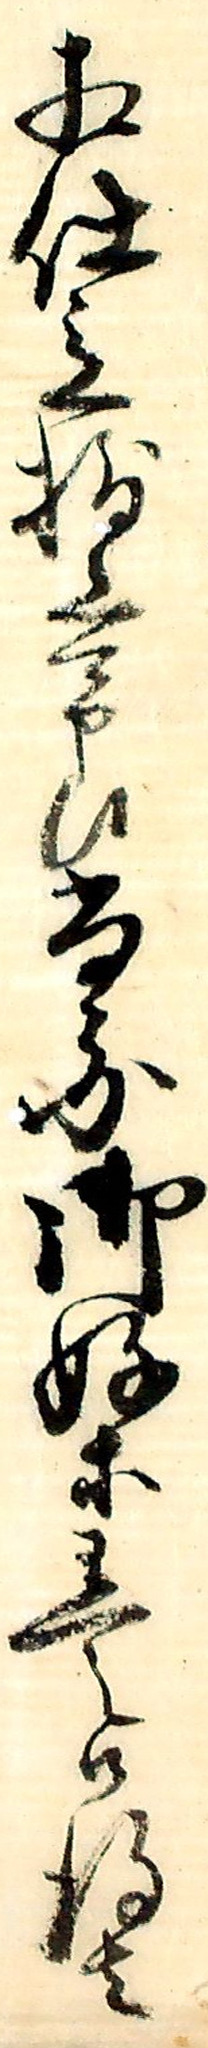相仕立指上可申候尚亦御好等有之候得は
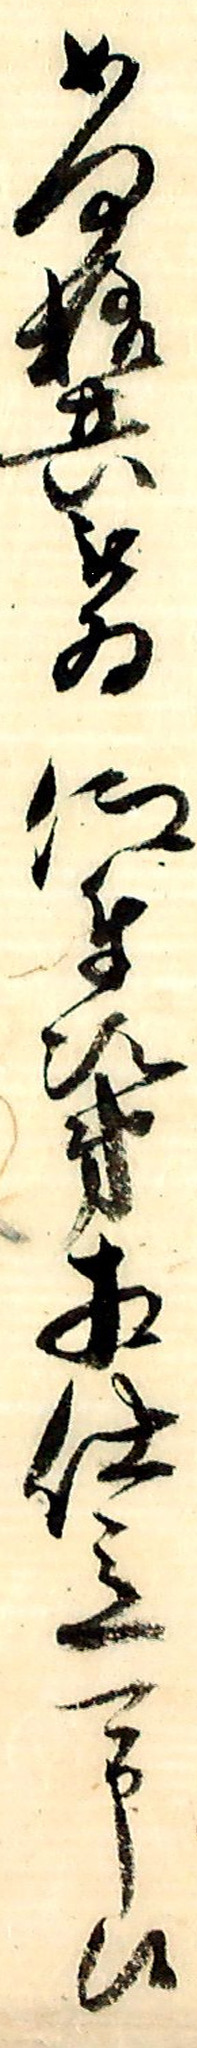如何様共被為仰付次第相仕立可申候
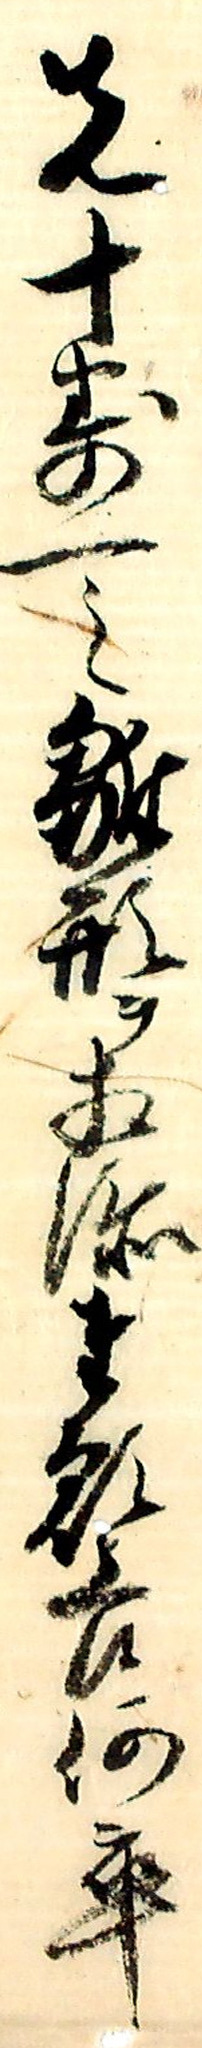先十歩一之雛形を相添奉願上候何卒
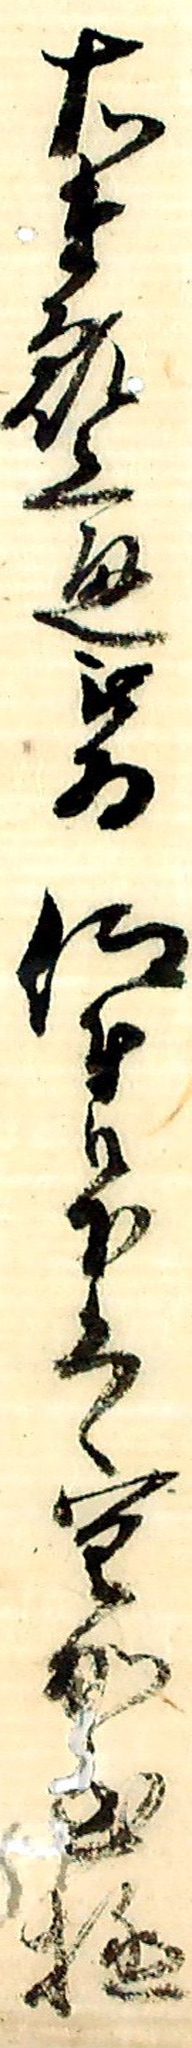右奉願上通被為仰付被下候はゝ冥加至極
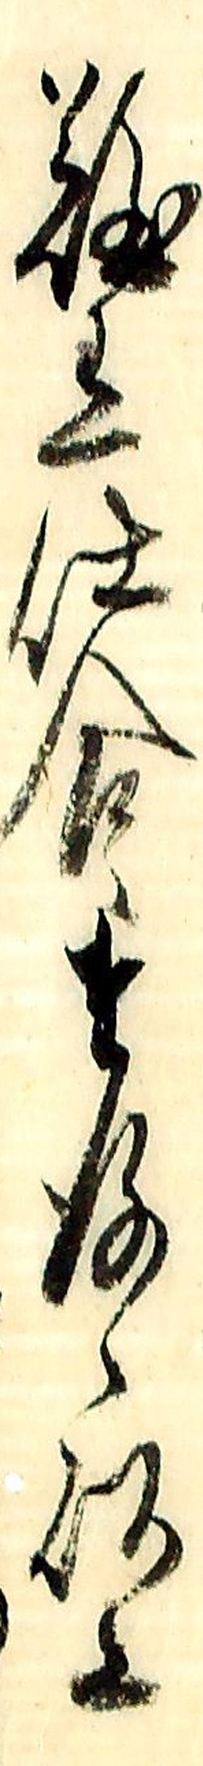難有仕合に奉存候以上
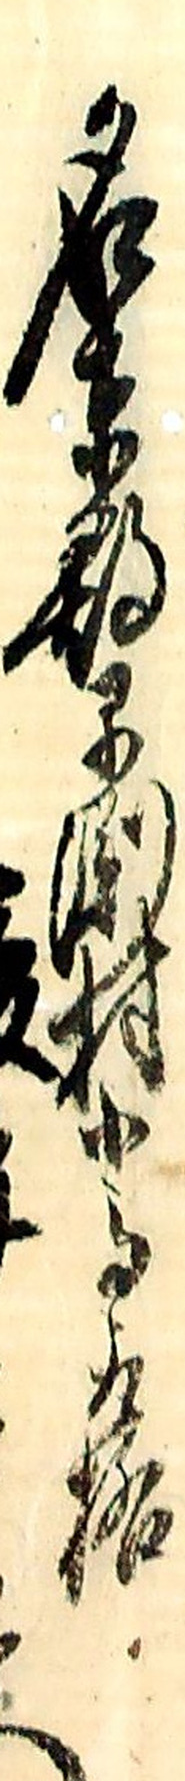名東郡早淵村小高取格
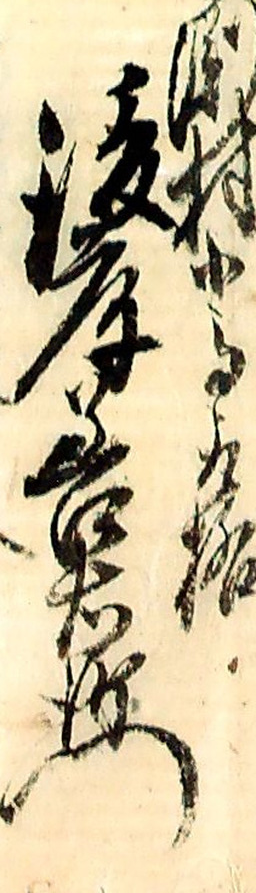後藤善右衛門
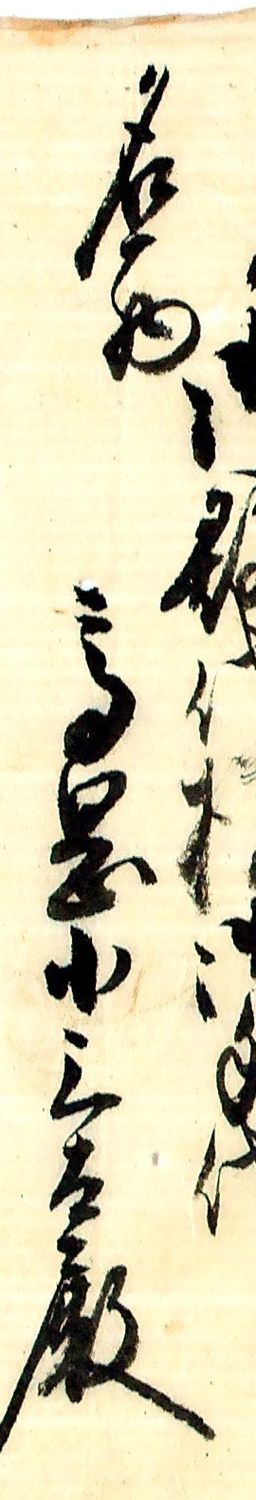高岡小三太殿
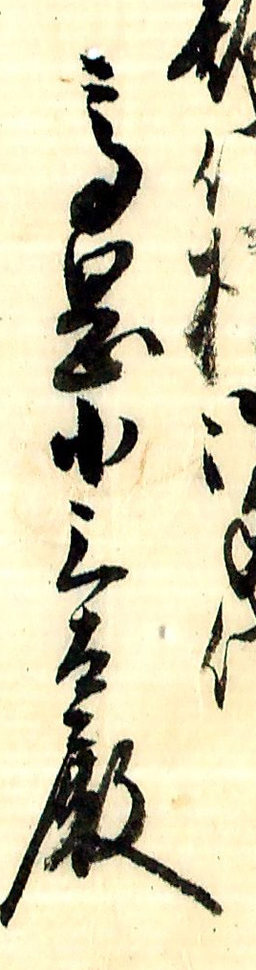高岡小三太殿

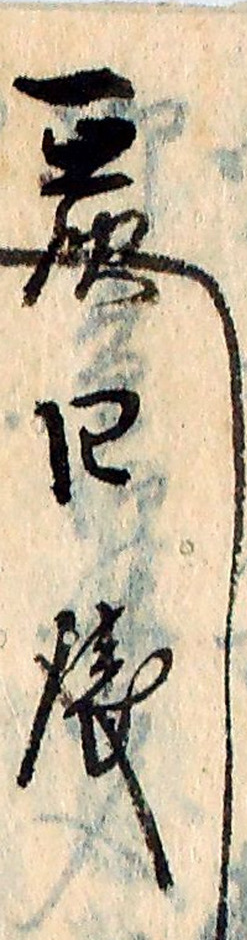一炭四俵
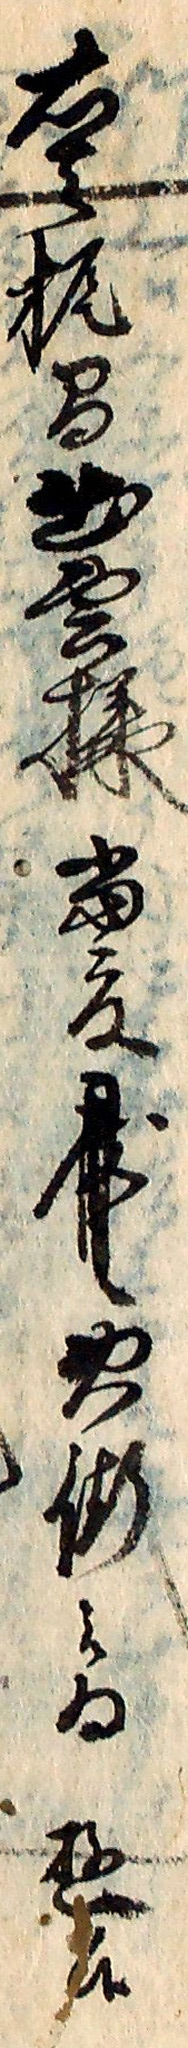右は梶間出雲様当夏火術被為遊候
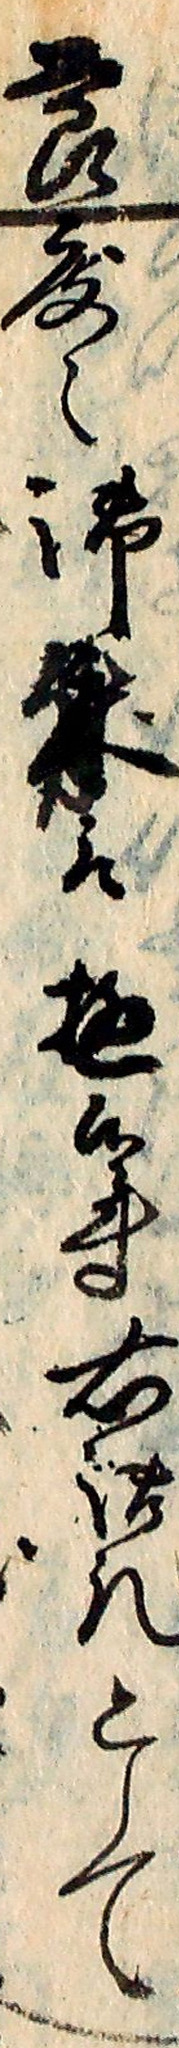節度々御休被遊候付右御礼として
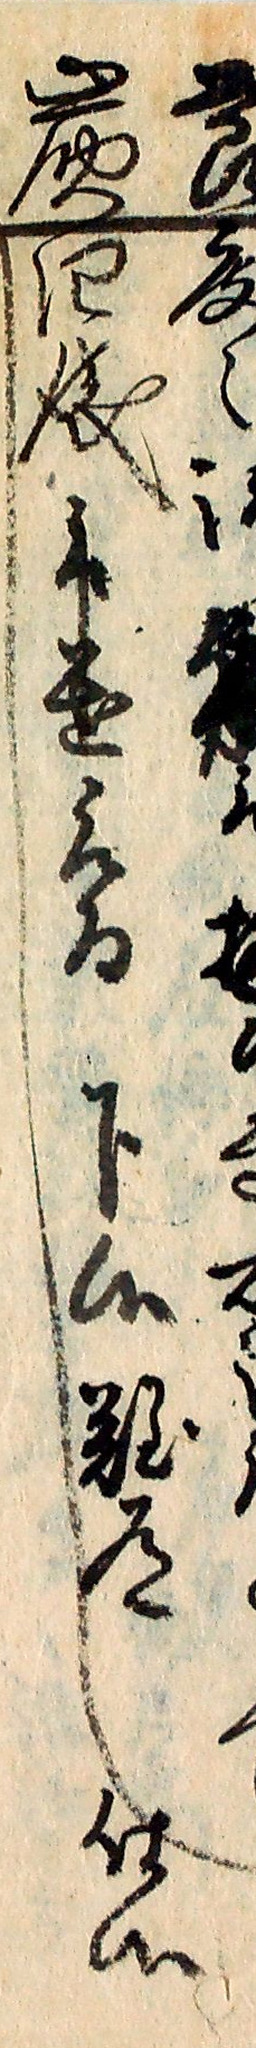炭四俵被遣被為下候難有仕候
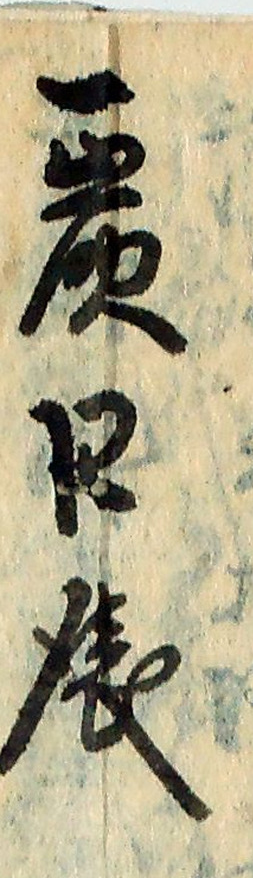一炭四俵
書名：諸御願書控(後藤氏壱番）
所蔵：鳴門教育大学 Naruto University of Education
